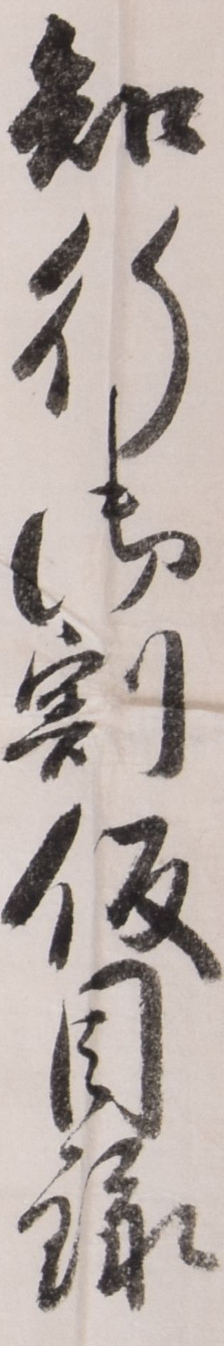知行御割仮目録
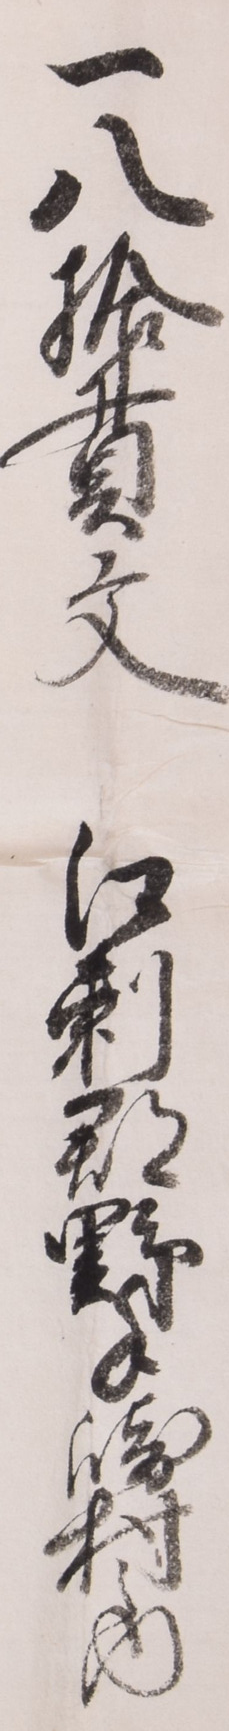一八拾貫文江刺郡野手崎村之内
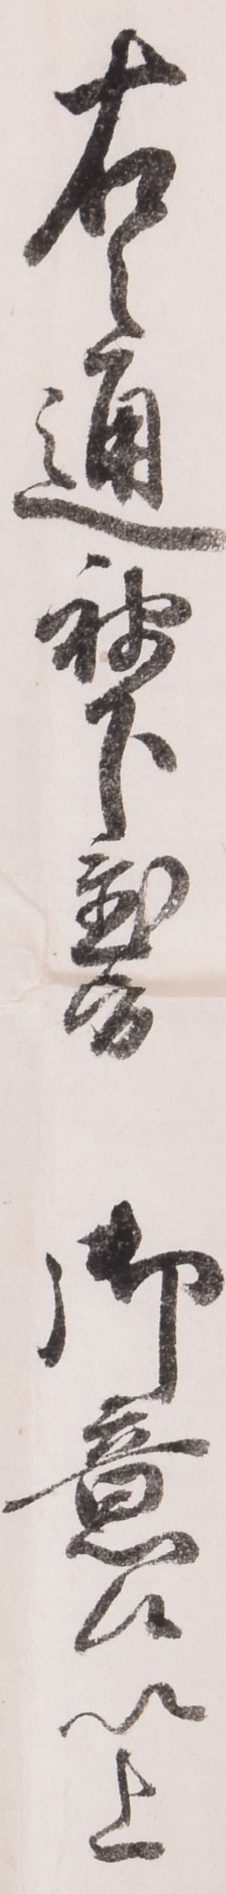右之通被下置旨御意候以上
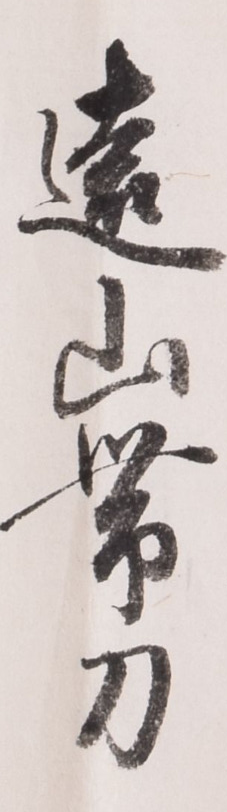遠山帯刀
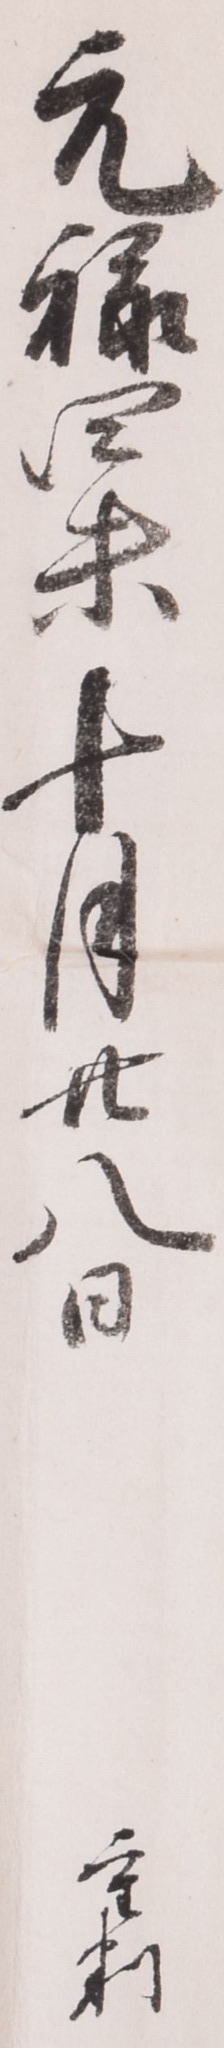元禄四未十月廿八日重判
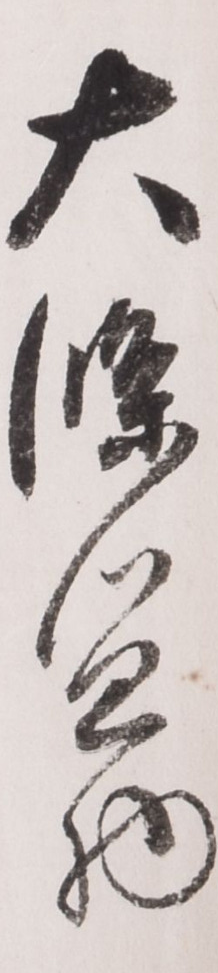大條監物
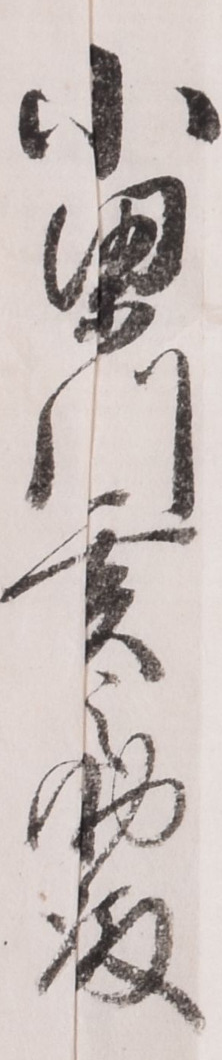小梁川亥之助殿
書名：知行御割仮目録
